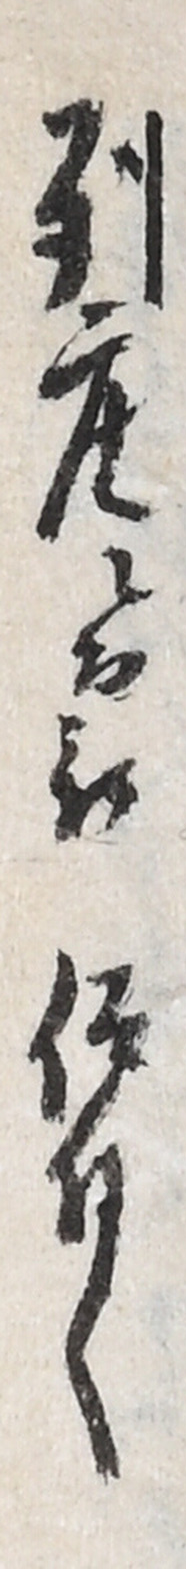列座ニ而被仰付候

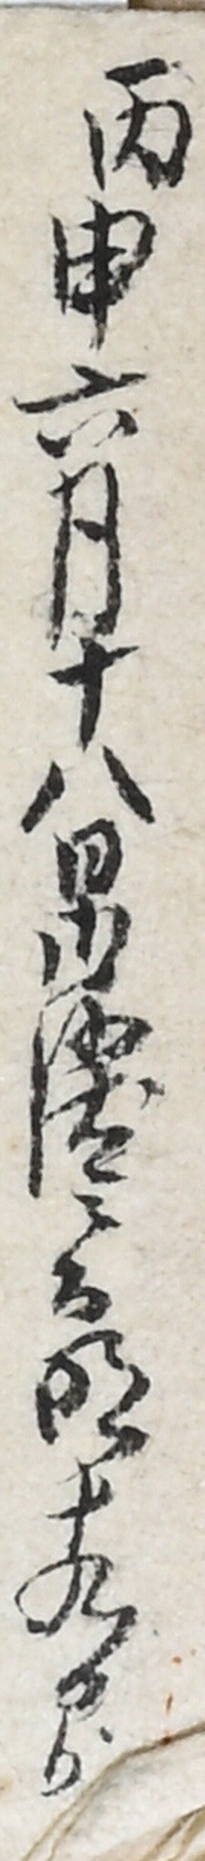申六月十八日御沙汰ニ而明十九日より
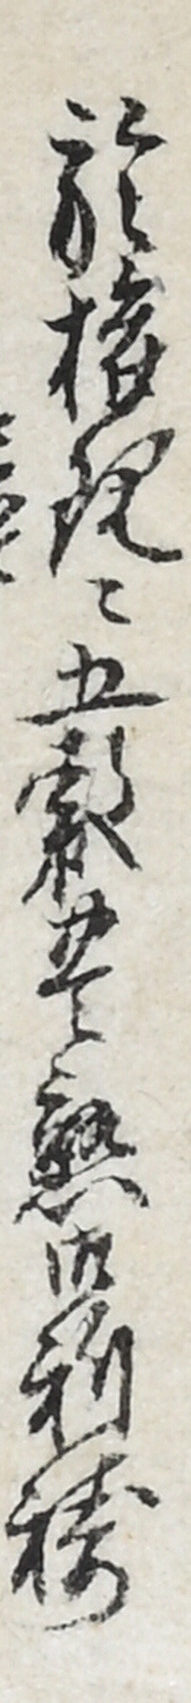於権現ニ五穀豊熟御祈祷
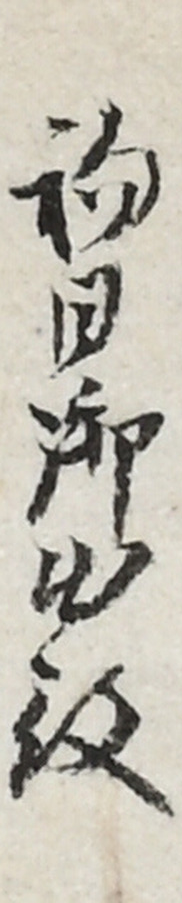初日御出役
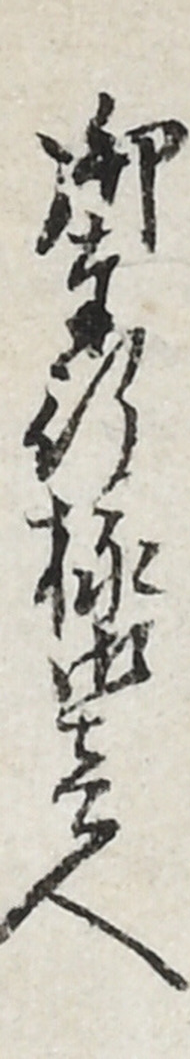御奉行様御壱人
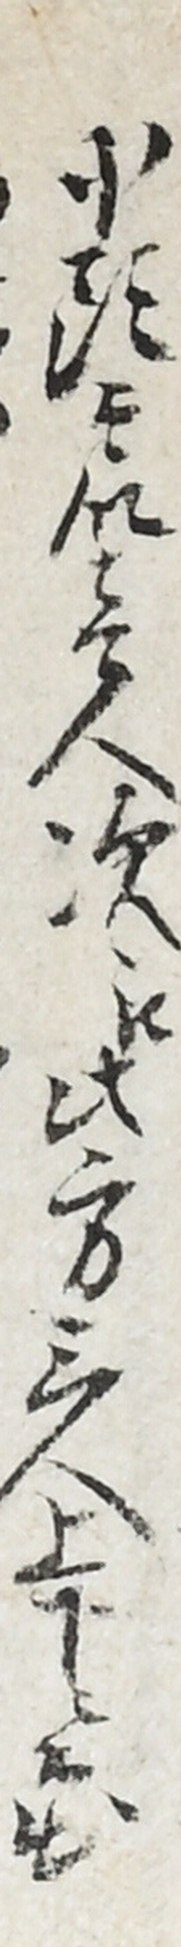小頭衆壱人次江此方三人上下二而出
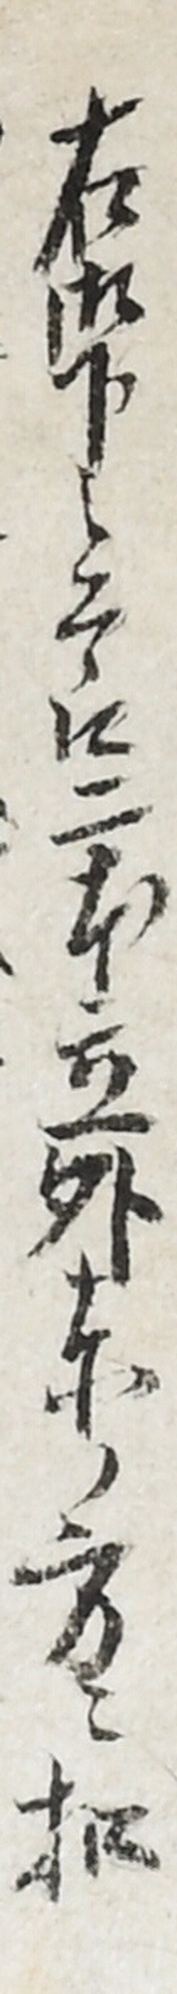右御下之節二本立外東ノ方ニ扣
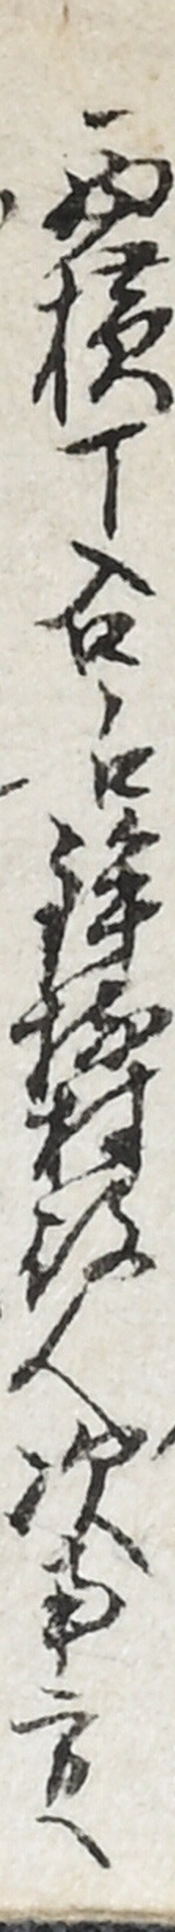西横丁谷江鉾持村役人次事方へ
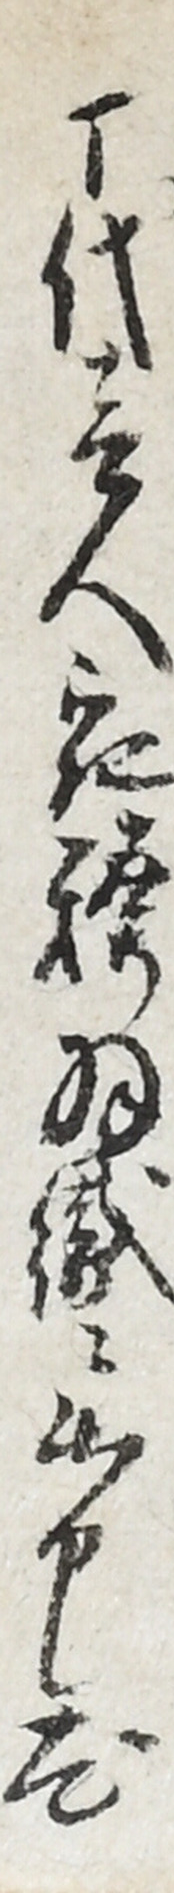丁代壱人宛袴羽織ニ被申出
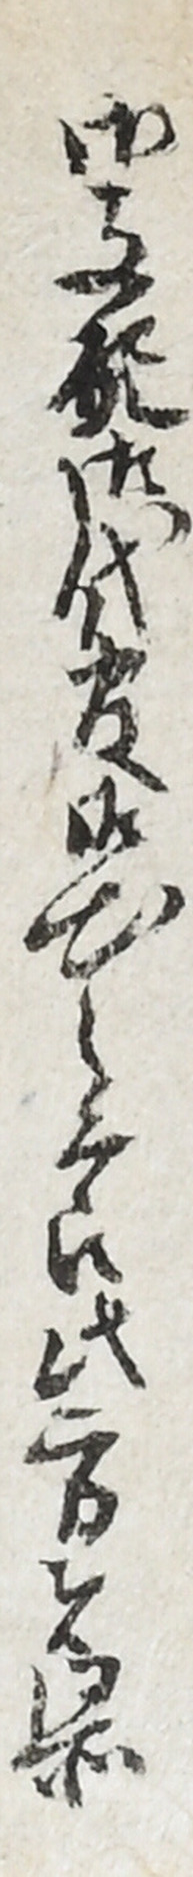御支配御代官御出之節此方者同所
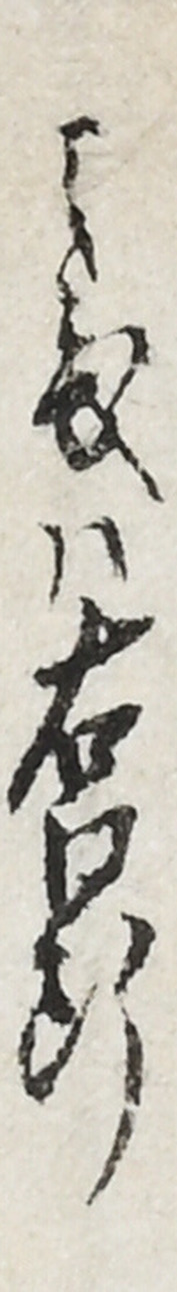之義ハ右同断
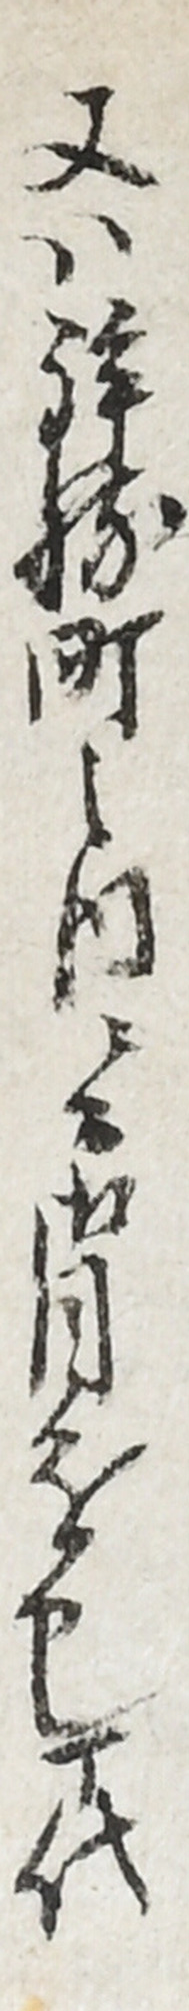又ハ鉾持町之内ニ而御目懸申候丁代
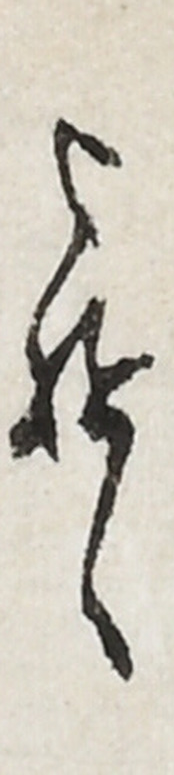被遊候
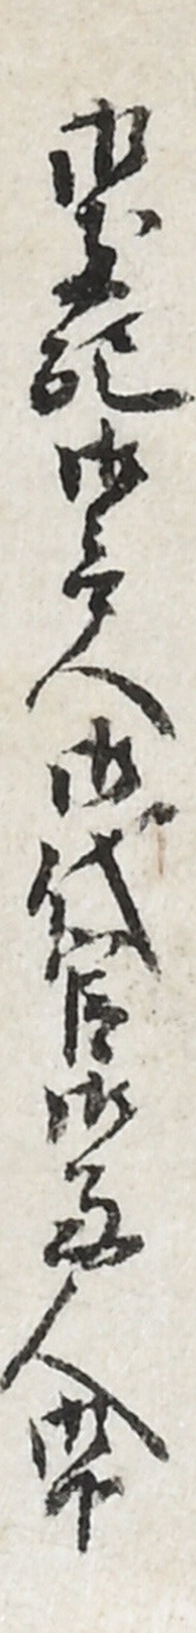御支配御壱人御代官御両人御外
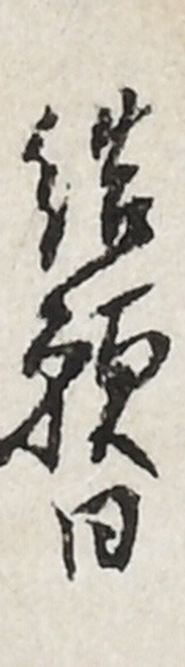結願同
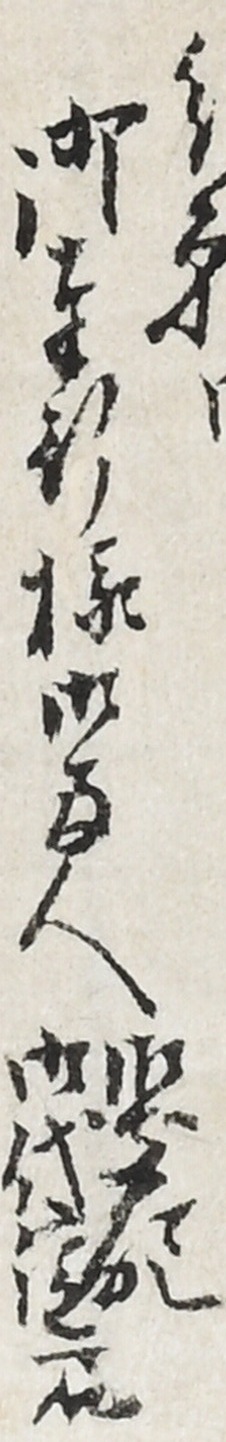御奉行様御両人御代官所
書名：年内行事懐中録
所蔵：伊那市立高遠町図書館・合同会社AMANE
